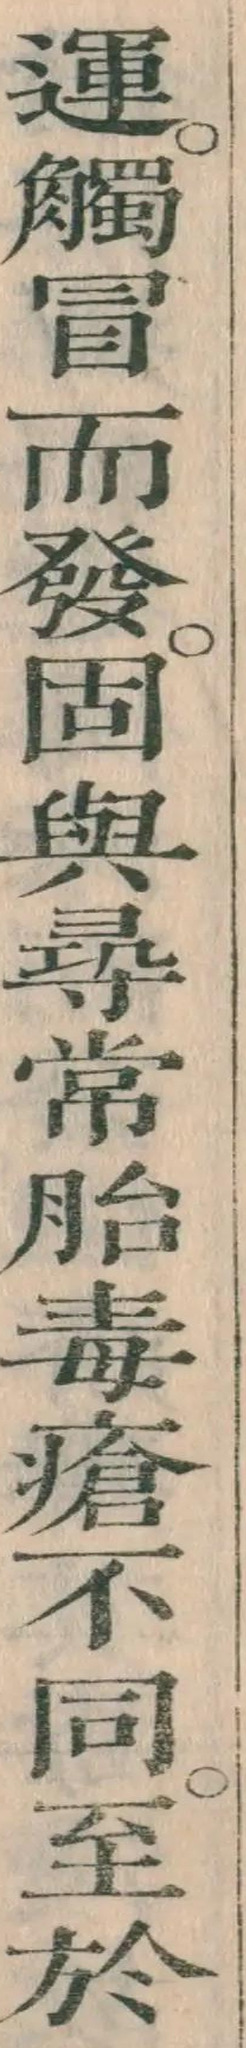運。触冒而発。固与尋常胎毒瘡不同。至於
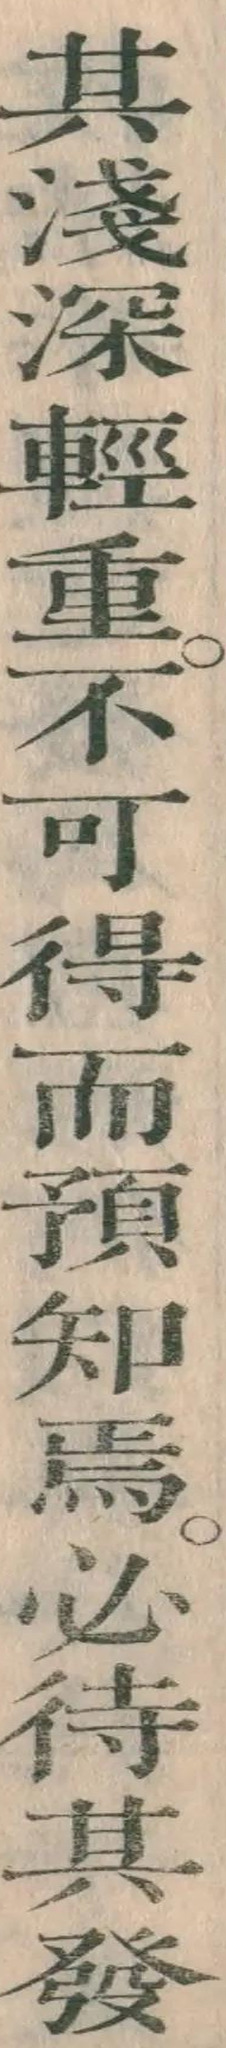其浅深軽重。不可得而預知焉。必待其発
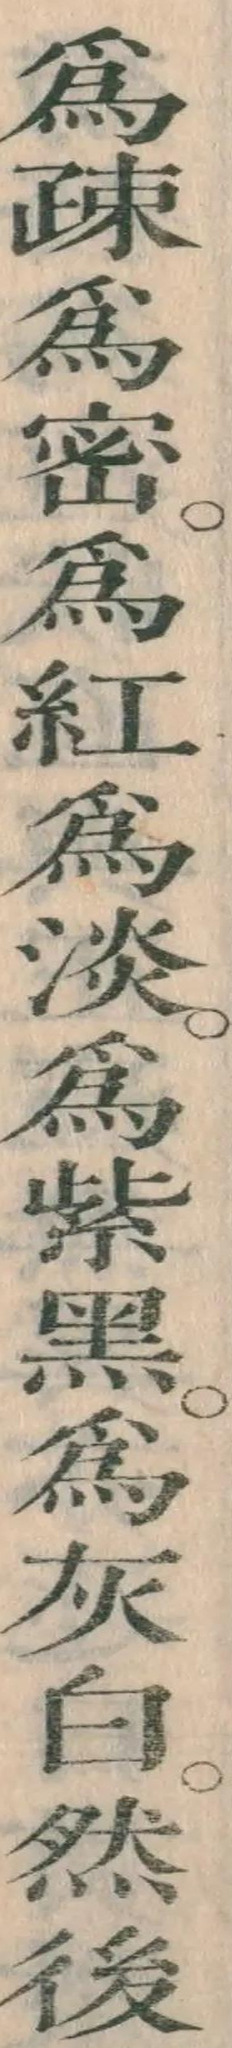為疎為密。為紅為淡。為紫黒。為灰白。然後
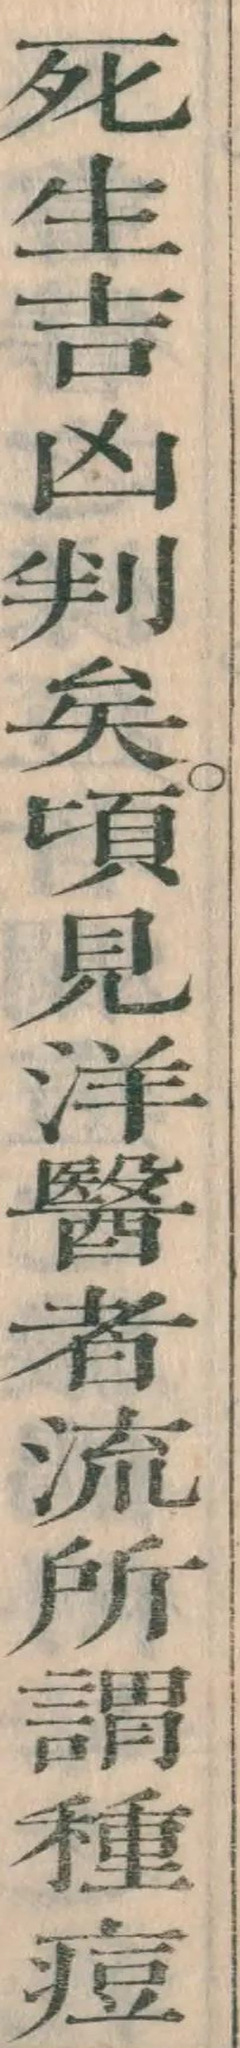死生吉凶判矣。頃見洋医者流所謂種痘
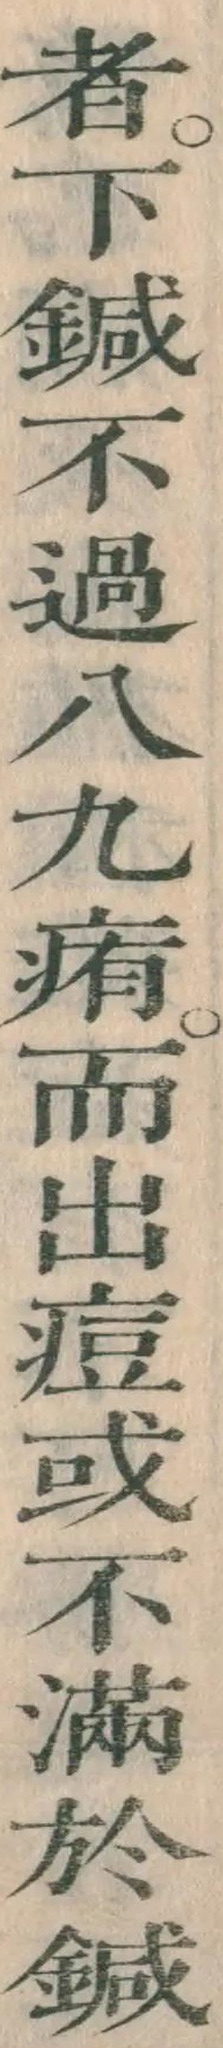者。下鍼不過八九痏。而出痘或不満於鍼
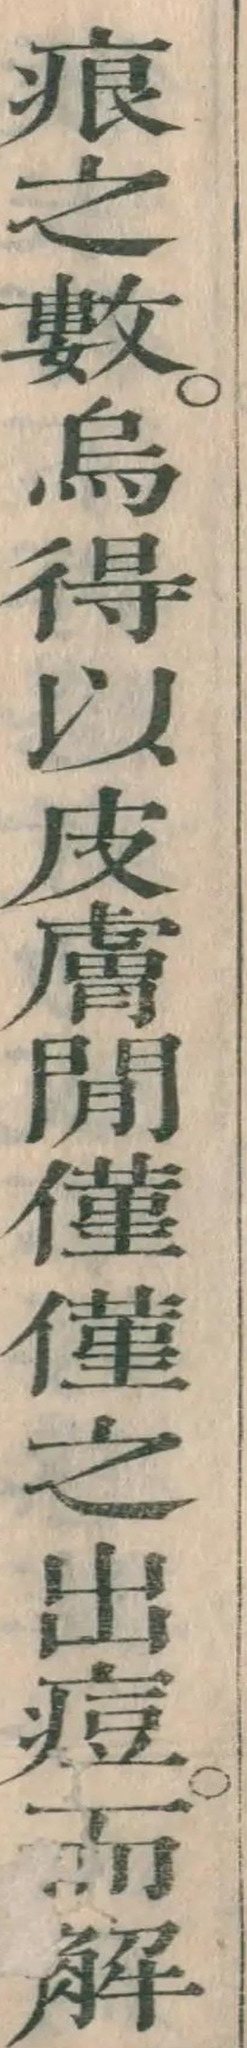痕之数。烏得以皮膚間僅僅之出痘。而解
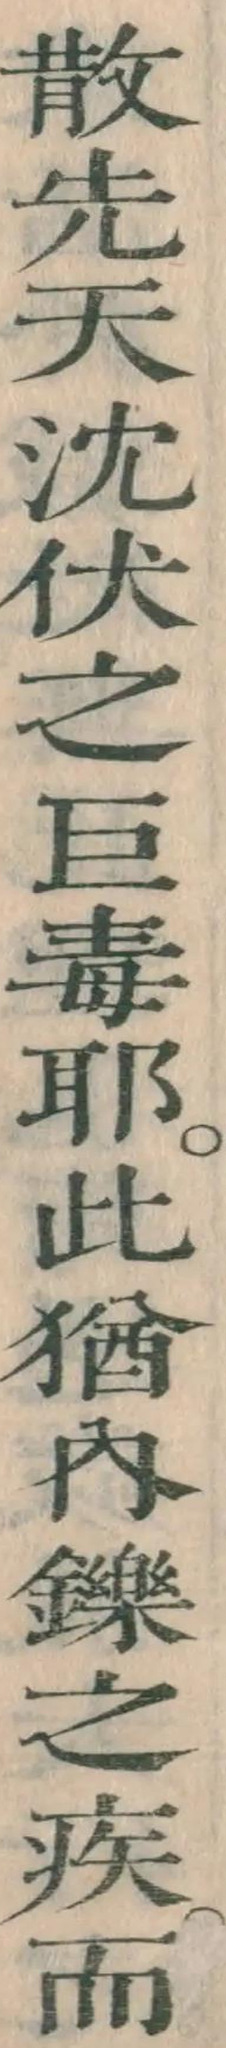散先天沈伏之巨毒耶。此猶内鑠之疾。而

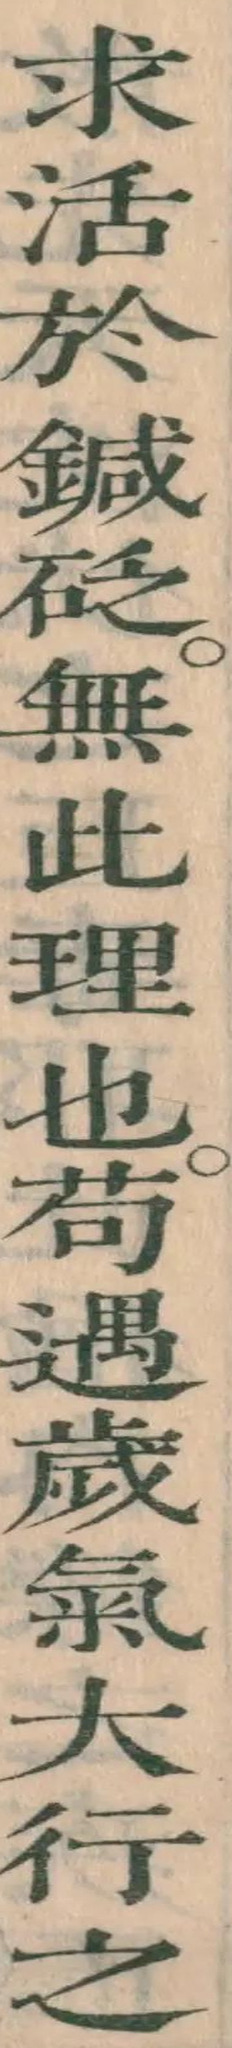求活於鍼砭。無此理也。苟遇歳気大行之
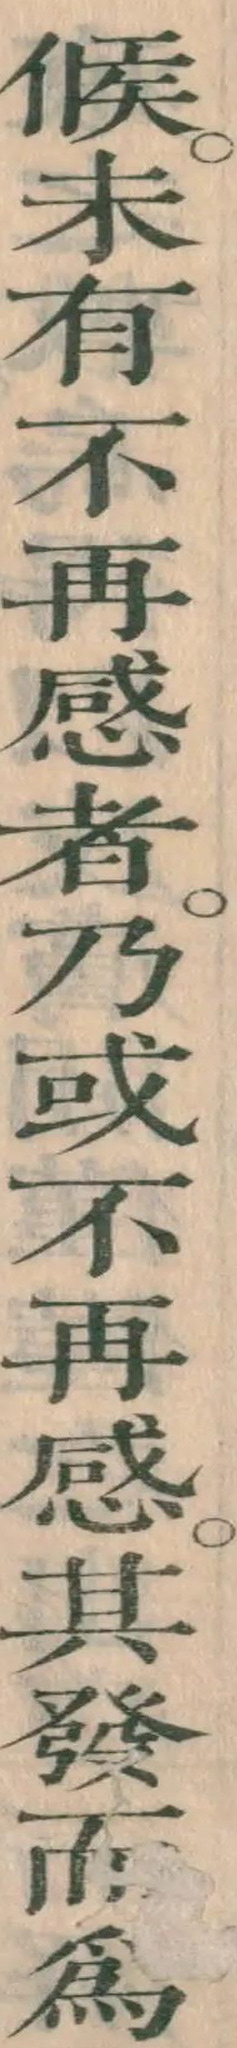候。未有不再感者。乃或不再感。其発而為
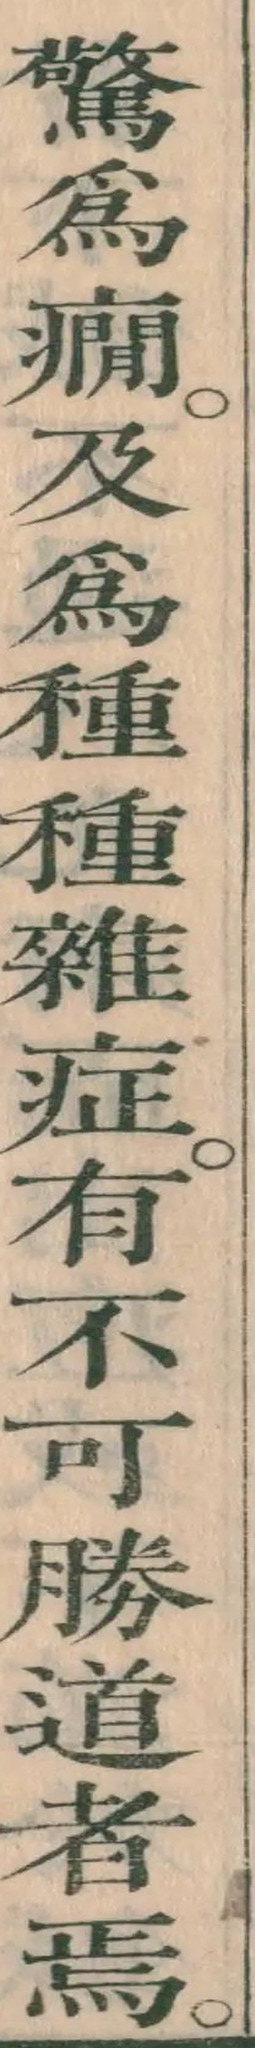驚為癇。及為種種雑症。有不可勝道者焉。
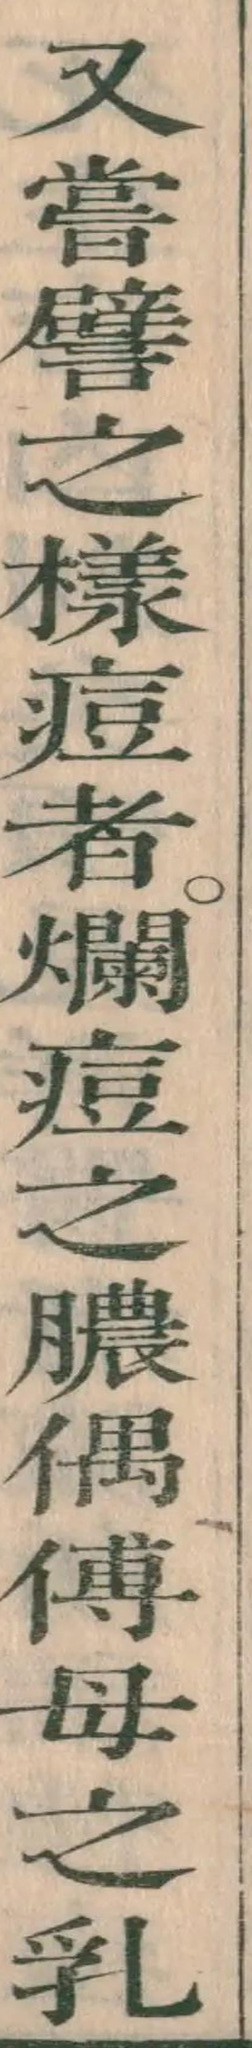又嘗譬之様痘者。爛痘之膿偶伝母之乳
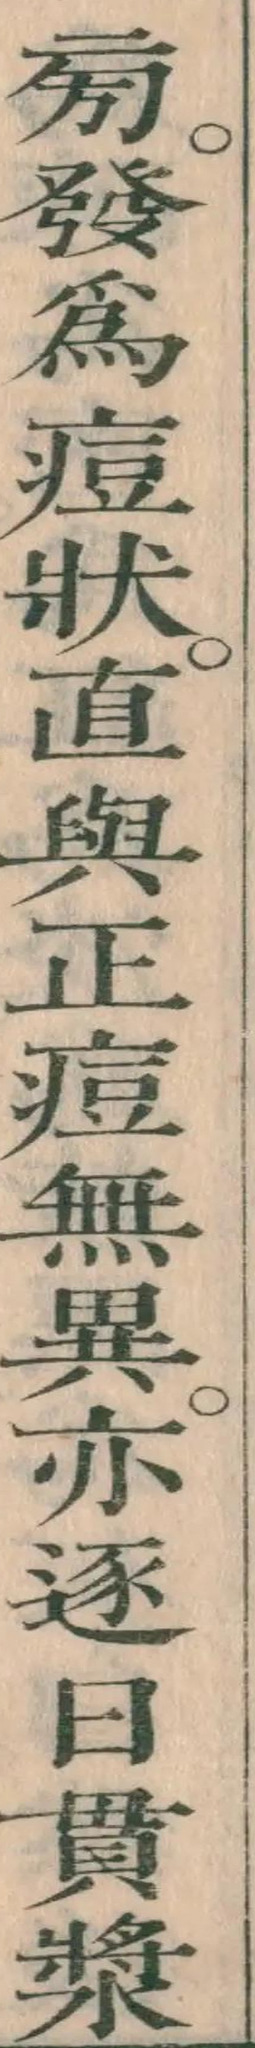㫄。発為痘状。直与正痘無異。亦逐曰貫漿
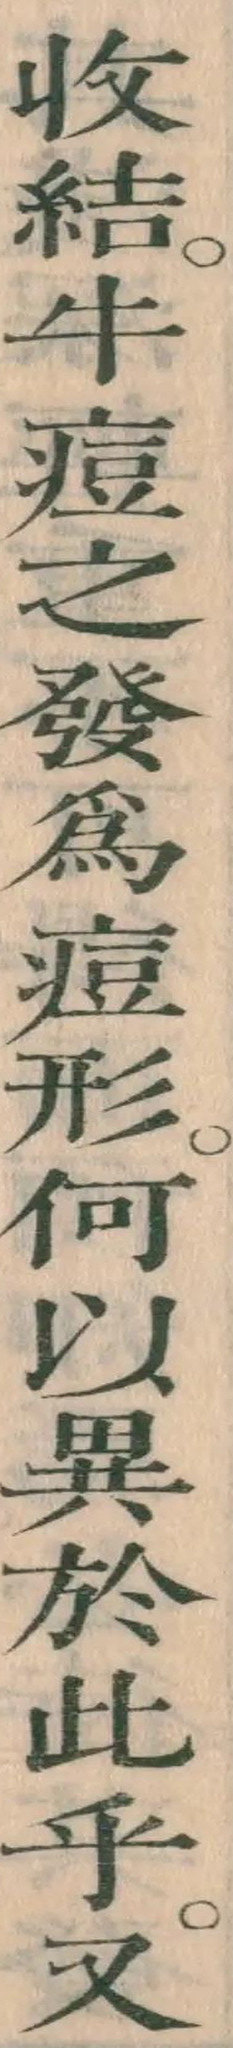収結。牛痘之発為痘形。何以異於此乎。又
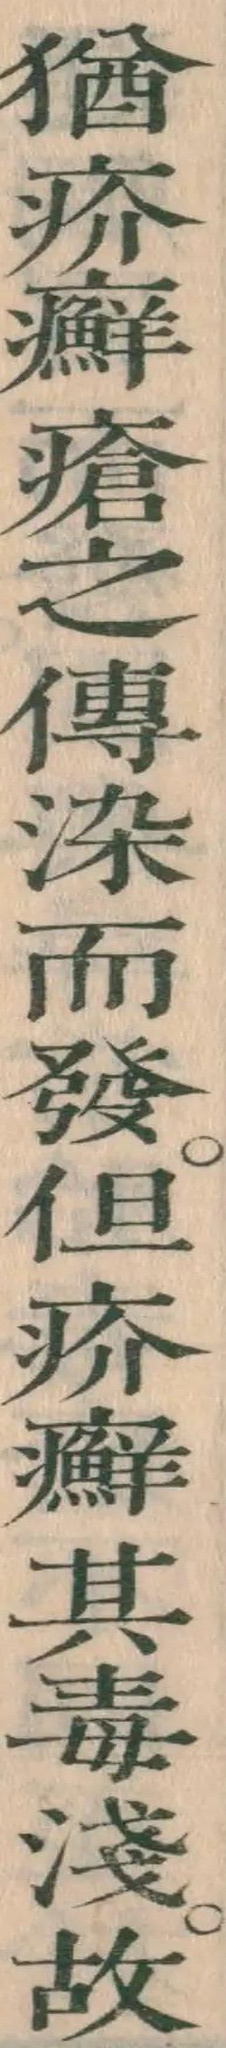猶疥癬瘡之伝染而発。但疥癬其毒浅。故
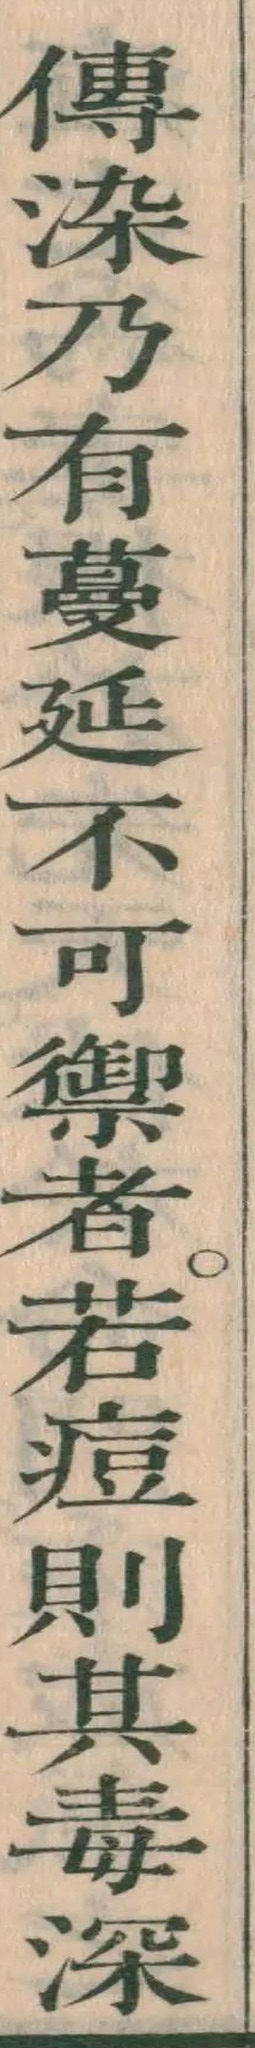伝染乃有蔓延不可禦者。若痘則其毒深
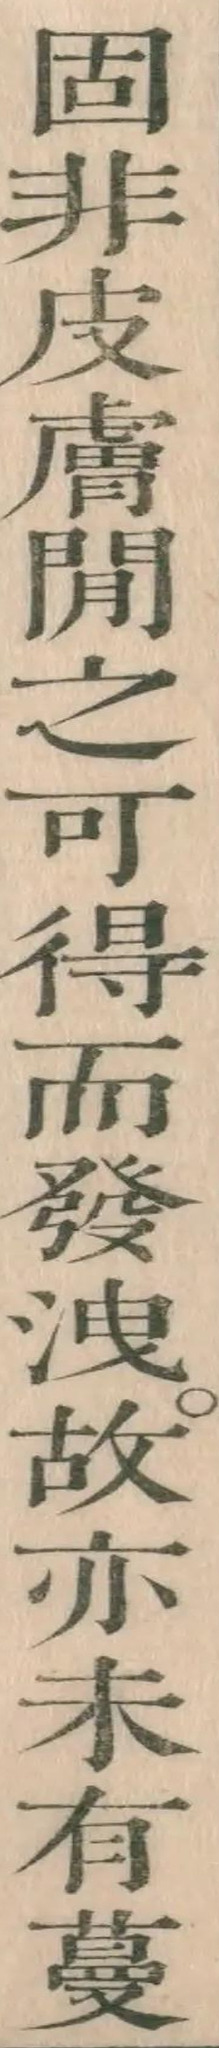固非皮膚間之可得而発拽。故亦未有蔓
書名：種痘弁義
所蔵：国立国会図書館 National Diet Library, JAPAN
